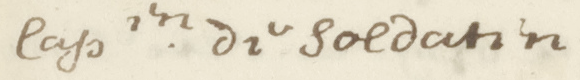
Capen de soldaten
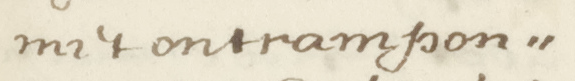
met ontrampon„
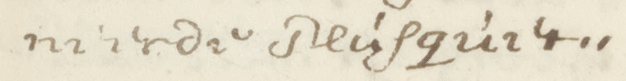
nierde musquet„
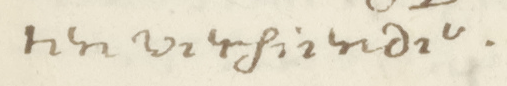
ten versiende.
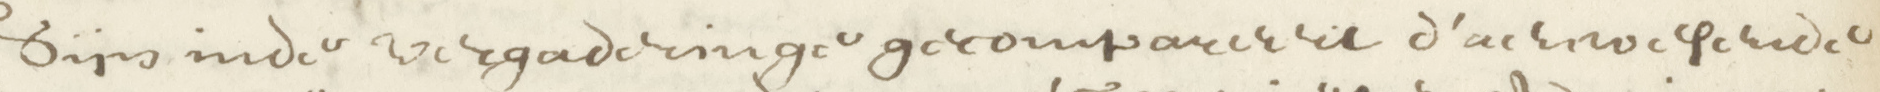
Sijn inde vergaderinge gecompareert d'aenwesende
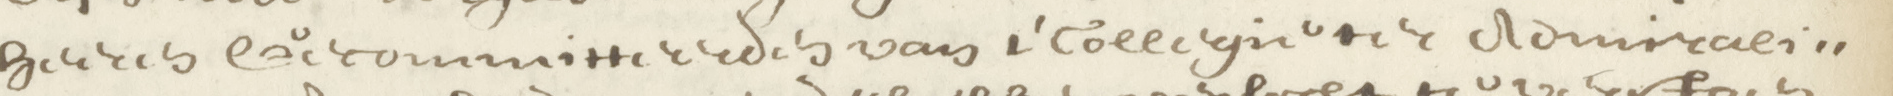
heeren Gecommitteerden van t'Collegie ter Admiraeli„
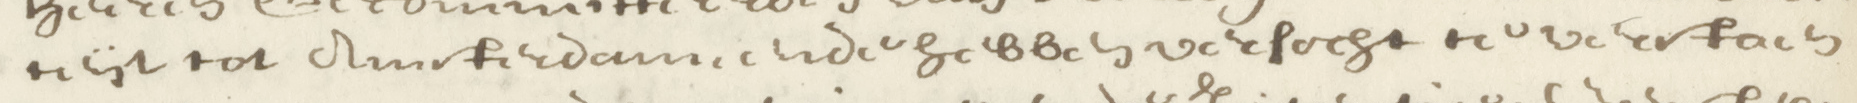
teijt tot Amsterdam, ende hebben versocht te verstaen
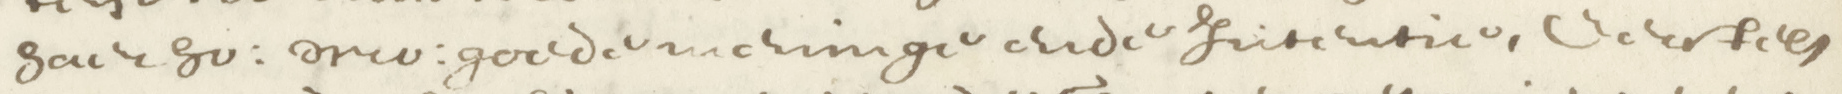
haere Ho:Mo: goede meninge ende Intentie. Eerstel
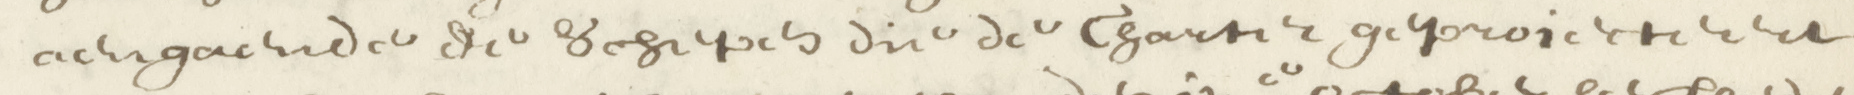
aengaende de Schepen die de Charter geproiecteert
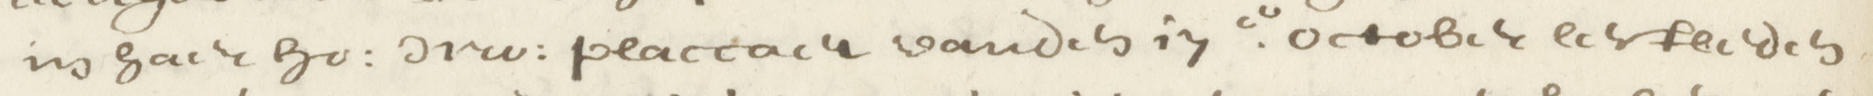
in haer Ho:Mo: placcaet van den 17en october lestleden
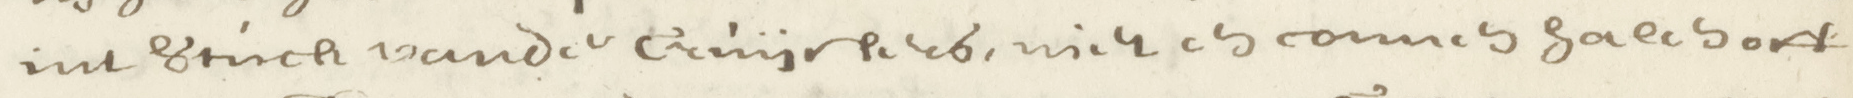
int Stuck vande cruijssers, niet en connen halen off
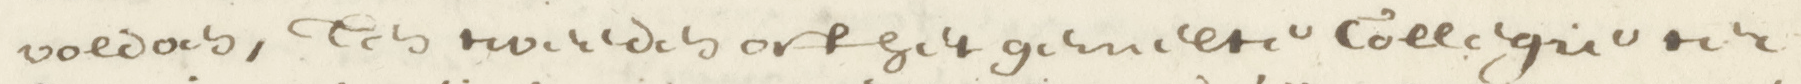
voldoen. Ten tweeden off het gemelte Collegie ter
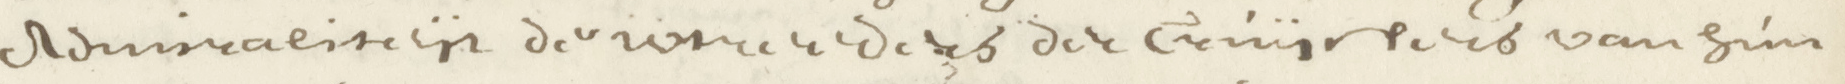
Admiraliteijt de wtreeders der cruijssers van hun
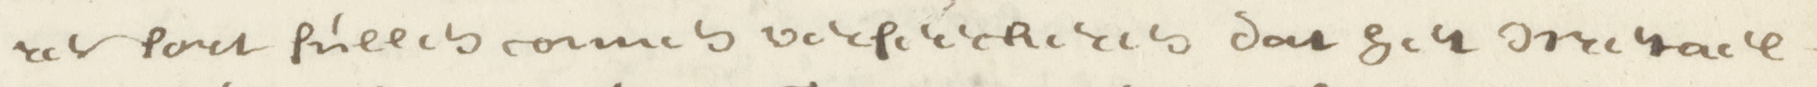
ressort sullen connen verseeckeren dat het metael
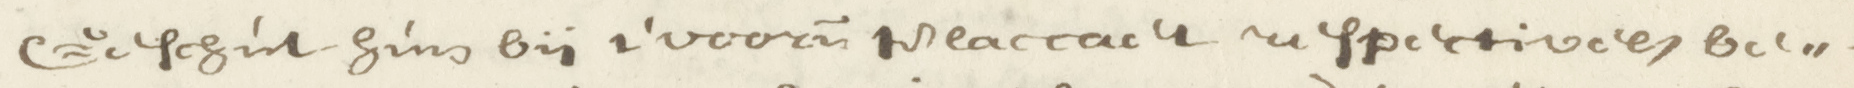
Geschut hun bij t'voorn placcaet respectivel be„
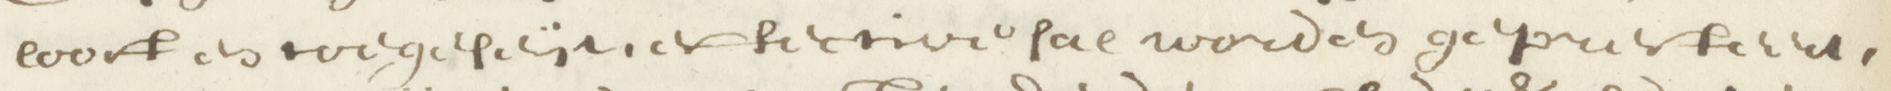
looft en toegeseijt effective sal worden gepresteert
